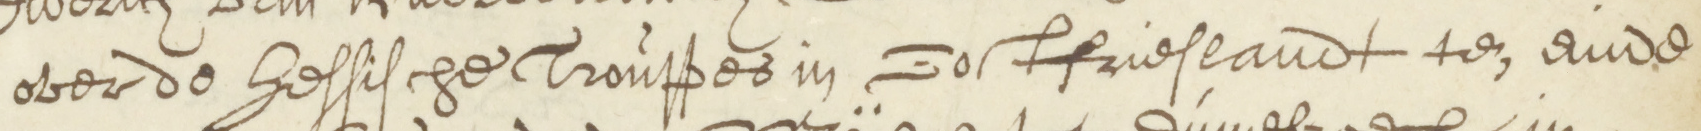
over de hessische Trouppes in Oostfrieslandt ten einde
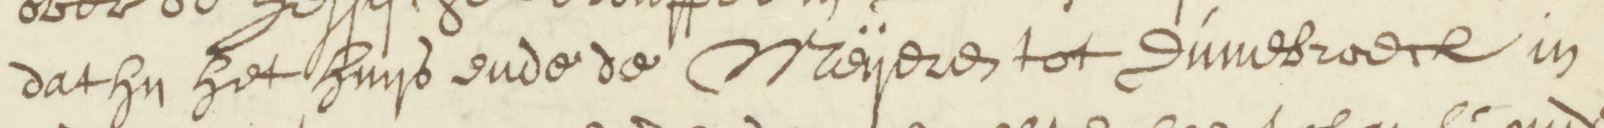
dat hy het huys ende de Meijeren tot Dumebroeck in
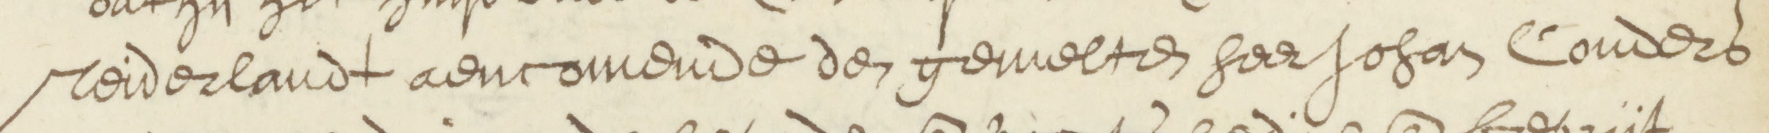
Reiderlandt aencomende den gemelten heer Johan Conders
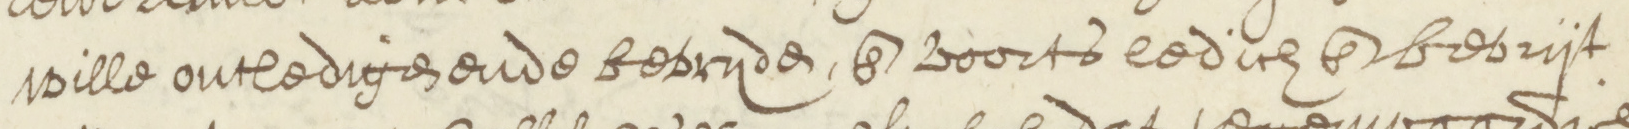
wille ontledigen ende bevryden, & voorts ledich & bevrijt
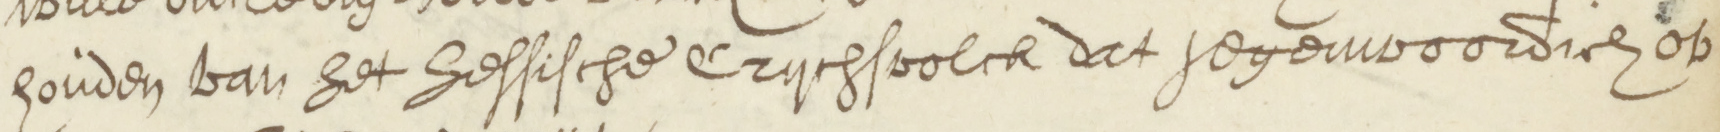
houden van het hessische Crychsvolck dat jegenwoordich op
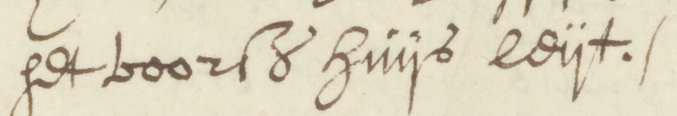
het voors huijs leijt.
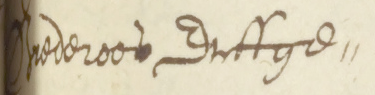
Brederoos Erffge„
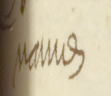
namen
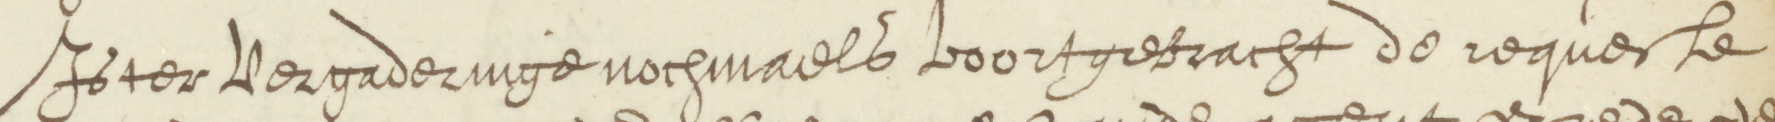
Is ter Vergaderinge nochmaels voortgebracht de requeste
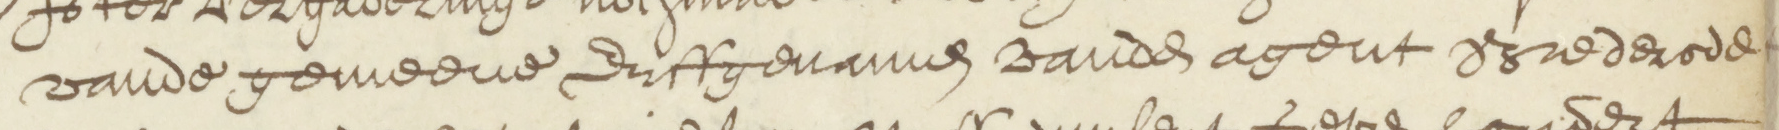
vande gemeene Erffgenamen vanden agent Brederode
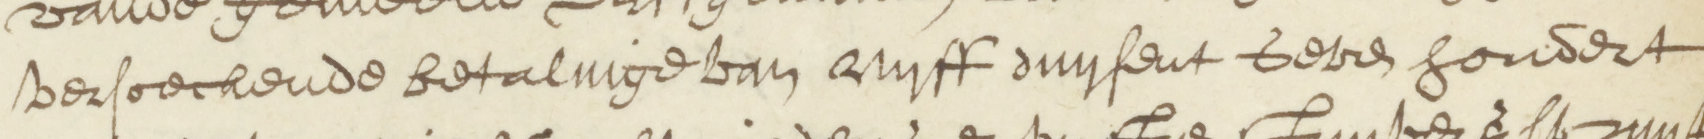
versoeckende betalinge van vyff duysent seven hondert
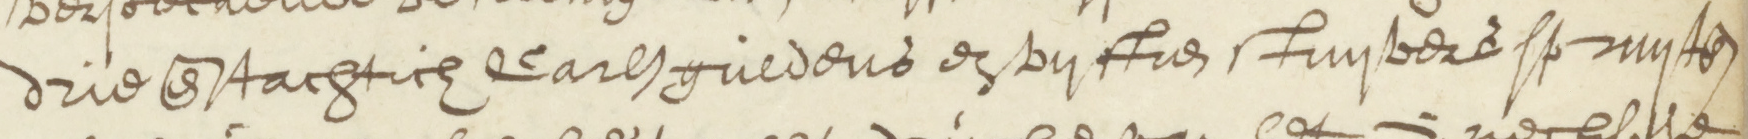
drie & tachtich Carl guldens en vyftien stuyvers spruyten
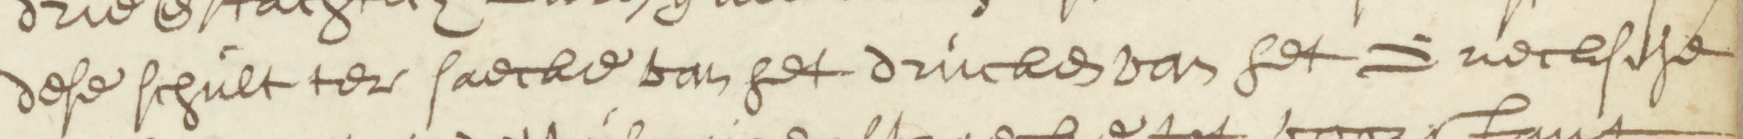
dese schult ter saecke van het drucken van het Griecksche
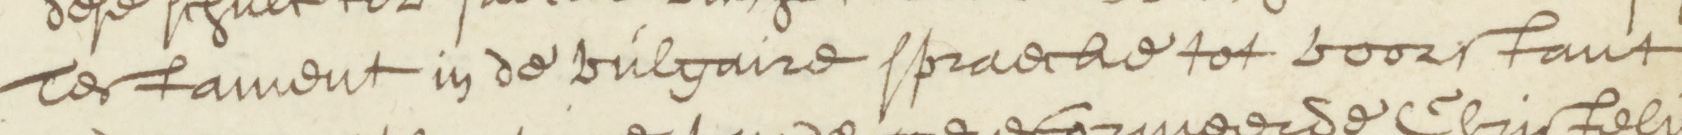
Testament in de vulgaire spraecke tot voorstant
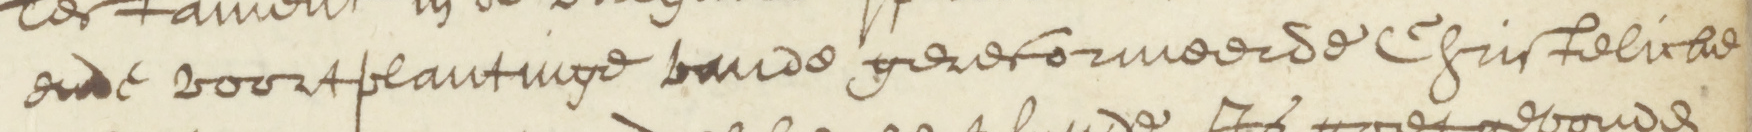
ende voortplantinge vande gereformeerde Christelicke
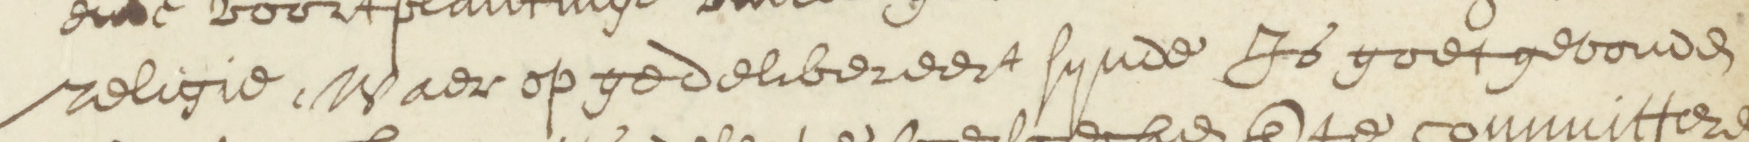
religie. Waer op gedelibereert synde Is goetgevonden
